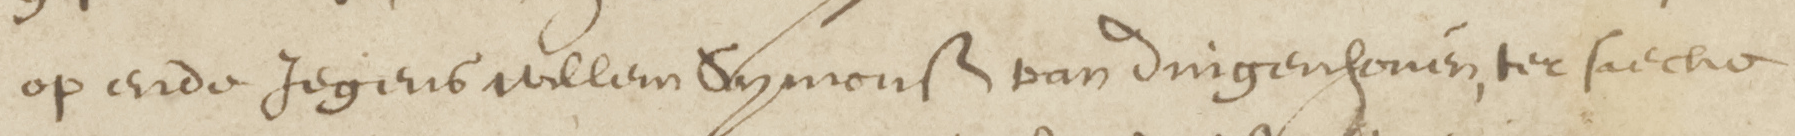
op ende Jegens willem Symonsz van Dingenhouen ter saecke
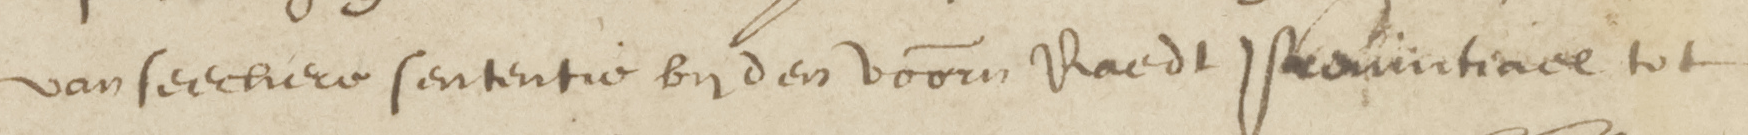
van seeckere sententie by den voorn Raedt Prouintiael tot
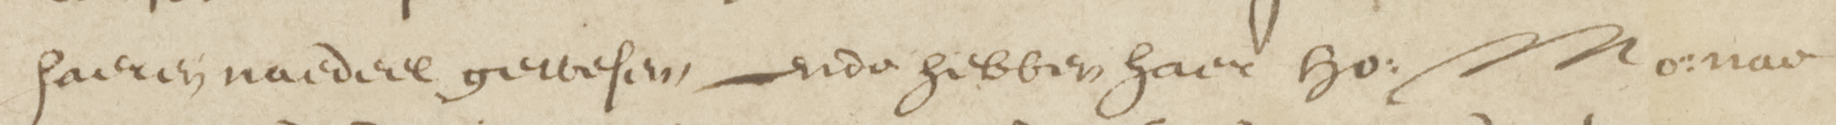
haeren naedeel gewesen, ende hebben haer ho:Mo: nae
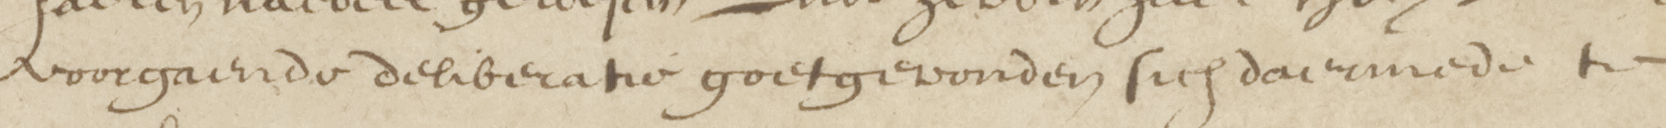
voorgaende deliberatie goetgevonden sich daermede te
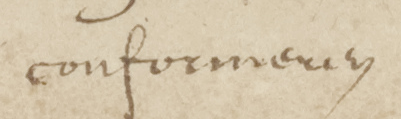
conformeren
